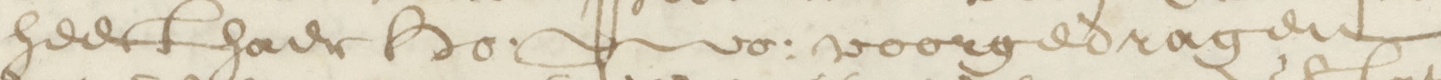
heeft haer Ho:Mo: voorgedragen,
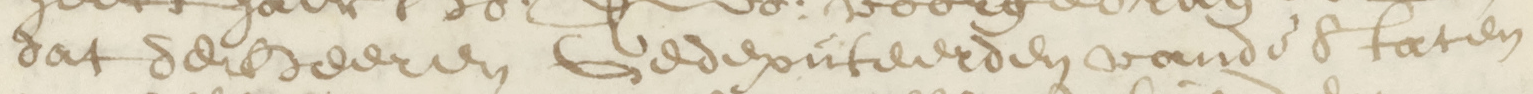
dat de Heeren Gedeputeerden vande Staten
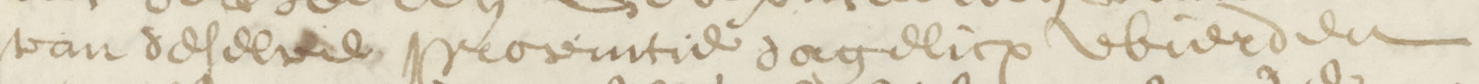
van deselve provintie dagelicx wierden
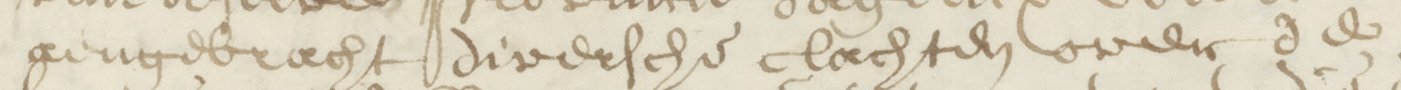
aengebracht diversche clachten over de
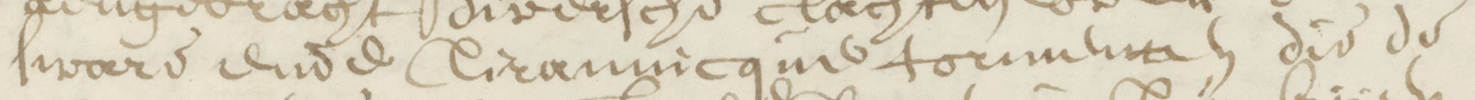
sware ende Tirannicque tormenten die de
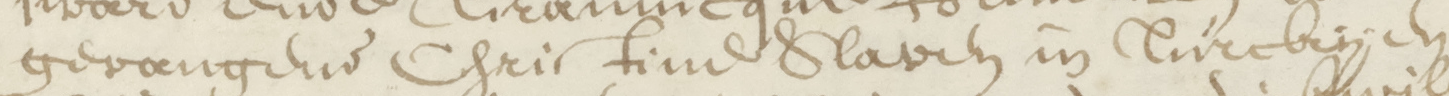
gevangene Christine Slaven in Turckijen
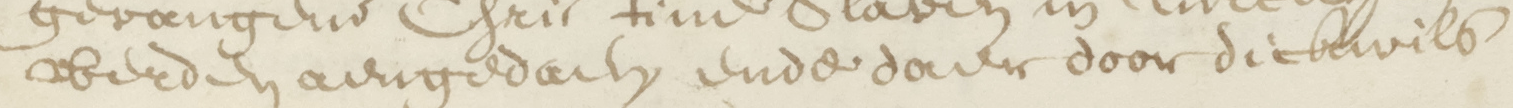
werden aengedaen, ende daer door dickwils
